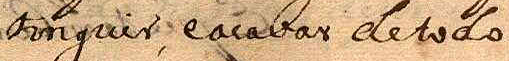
tinguir, e acabar de todo.
